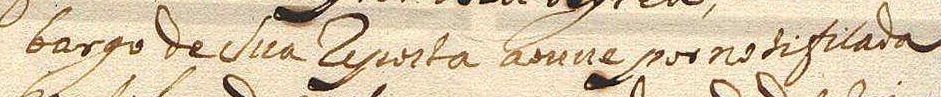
bargo de sua Reposta a ouue por notificada
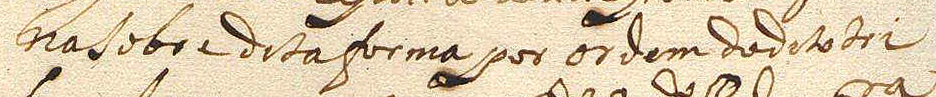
na sobredita forma por ordem do dito tri
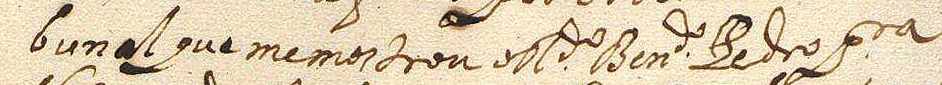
bunal que me mostrou o R.do Ben.do Pedro p.ra
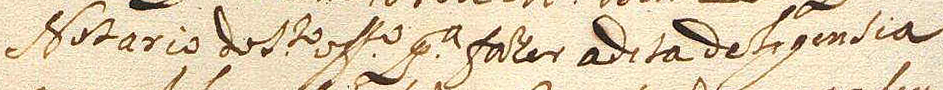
Notario do s.to off.o p.a fazer a dita deligensia
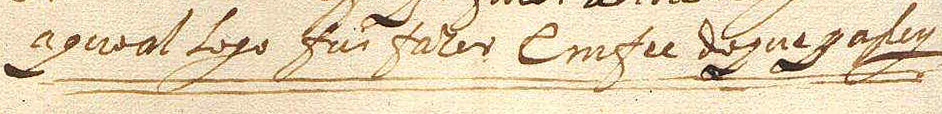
a quoal logo fui fazer Em fee do que passey
